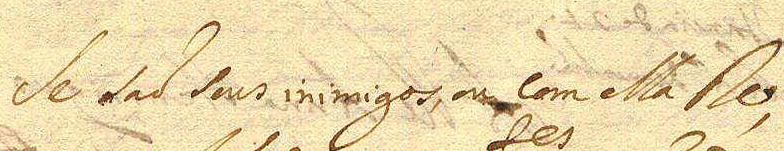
Se saõ seus inimigos, ou com ella Re,
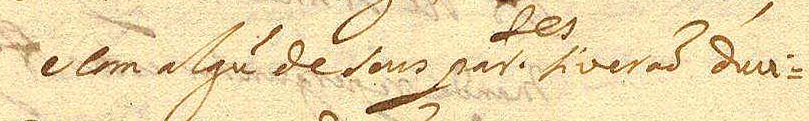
e com algū de seus par.tes tiveraõ dui
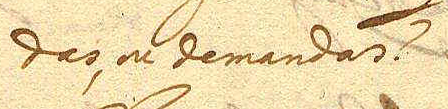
das, ou demandas?
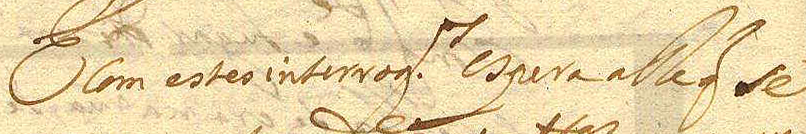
E com estes interrog.os espera a Re q̄ se
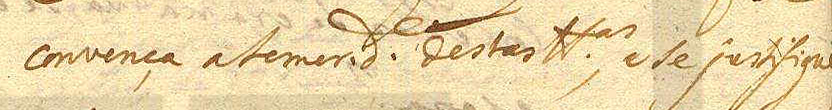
convença a temerid.e destas tt.as, e se justifiqu
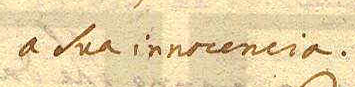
a sua innocencia.
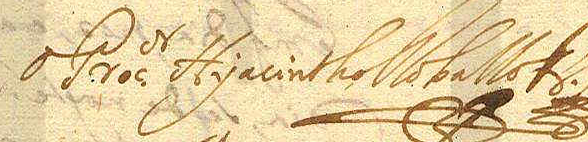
o Proc.or Hyacintho Roballo Fr.
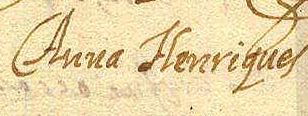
Anna Henriques
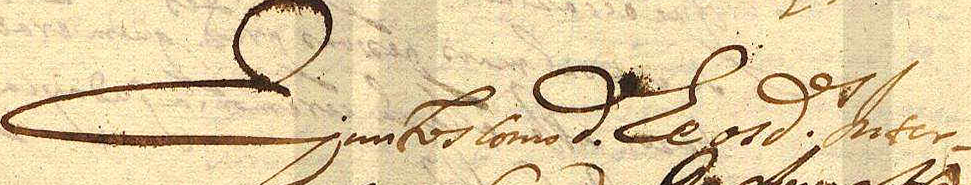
E juntos como d.o he os d.os Inter
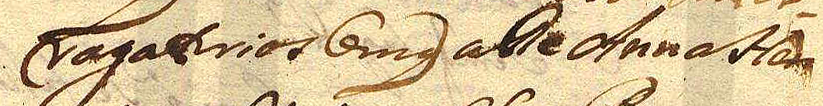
rogatorios Com q̄ a Re Anna Hen
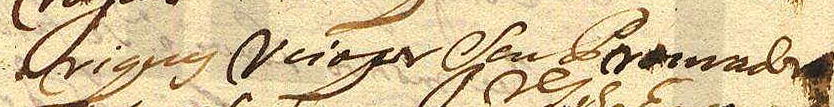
riques veio por Seu Procurador
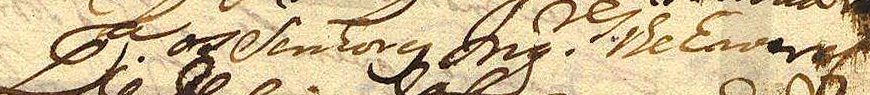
pa. os Senhores Inq.res lhe havereꝭ
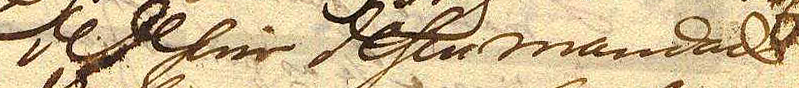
de deferir de seu mandado
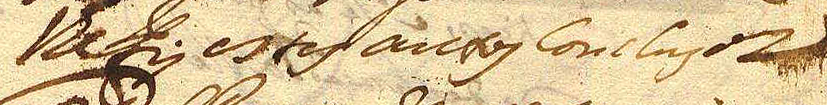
lhe fis estes autos Conclusoz
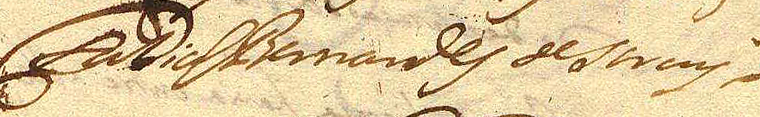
Fabiaõ Bernardes o escreuj
